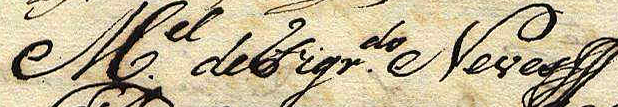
M.el de Figr.do Neves
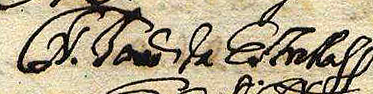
Fr. Ioaõ da Estrella
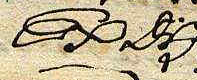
Ex Dif
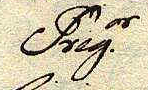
Preg.or
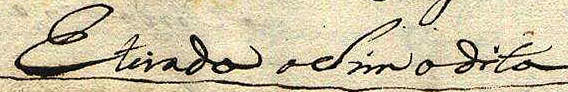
E tirado aSim o dito
